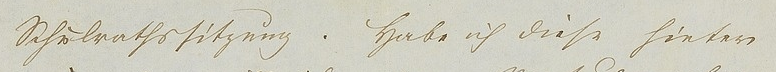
Schulrathssitzung. Habe ich diese hinter
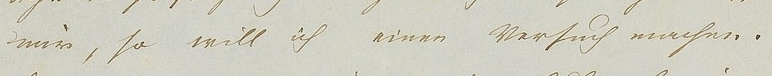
mir, so will ich einen Versuch machen.
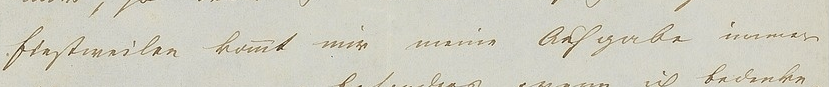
Einstweilen kommt mir meine Aufgabe immer
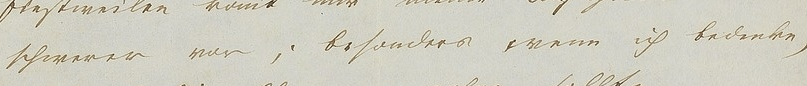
schwerer vor; besonders wenn ich bedenke,
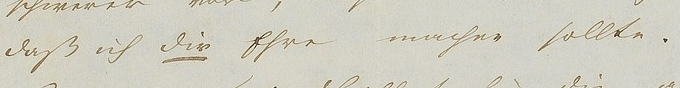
daß ich dir Ehre machen sollte.
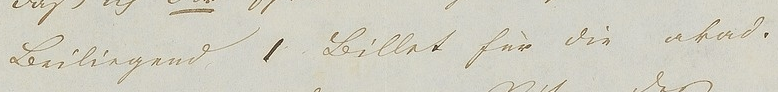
Beiliegend 1 Billet für die akad.
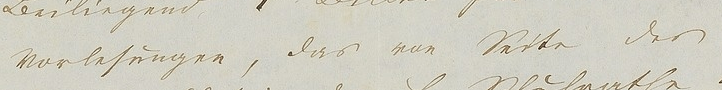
Vorlesungen, das von Seite des
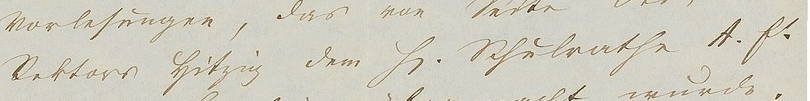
Rektorn Hitzig dem Herrn. Schulrathe A. E.
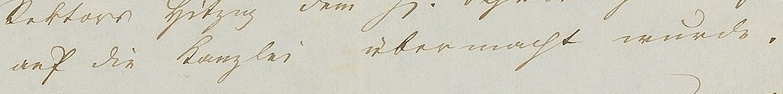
auf die Kanzlei übermacht wurde.
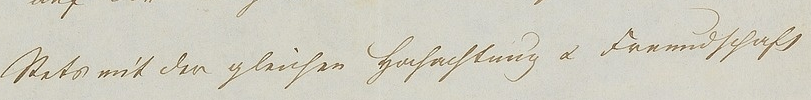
Stets mit der gleichen Hochachtung & Freundschaft
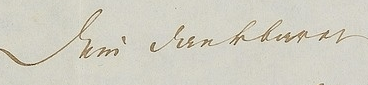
dein dankbarer
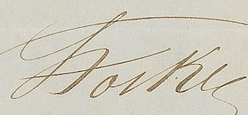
Stocker
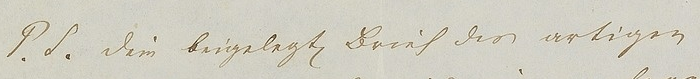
P. S. dein beigelegter Brief des artigen
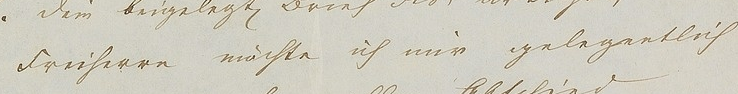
Freiherrn möchte ich mir gelegentlich
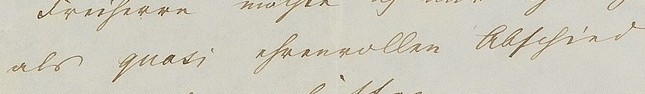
als quasi ehrenvollen Abschied
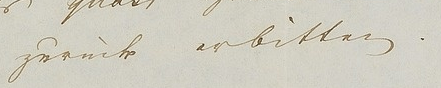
zurück erbitten.
